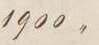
1900 "
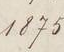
1875
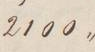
2100 "
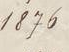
1876
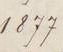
1877
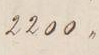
2200 "
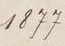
1877
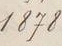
1878
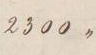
2300 "
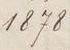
1878
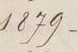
1879
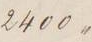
2400 "
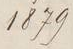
1879
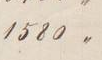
1880
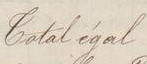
Total égal
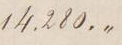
14.280. "
